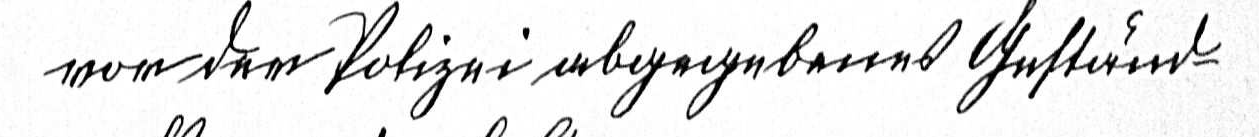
vor der Polizei abgegebenes Geständ¬
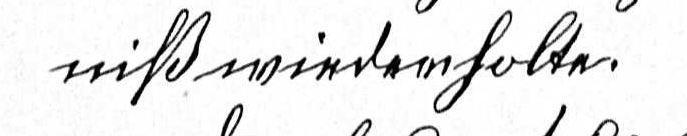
niß wiederholte.
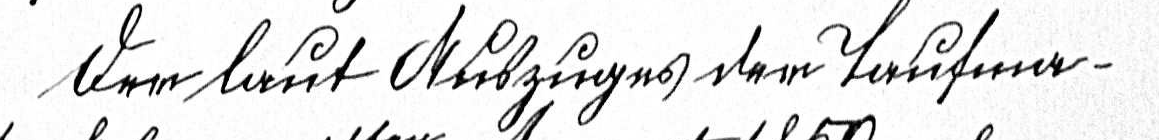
Der laut Auszuges der Taufma¬
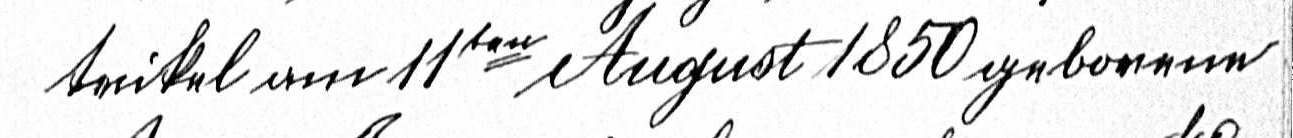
trikel am 11ten August 1850 geborene
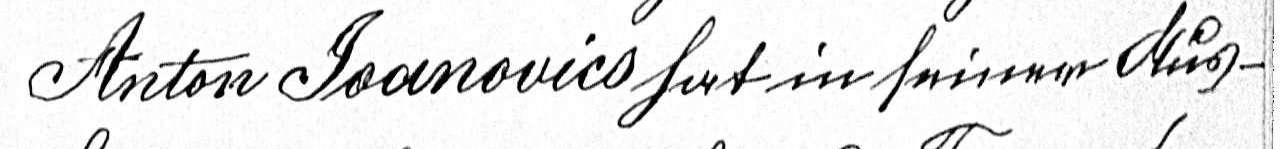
Anton Ioanovics hat in seiner Aus¬
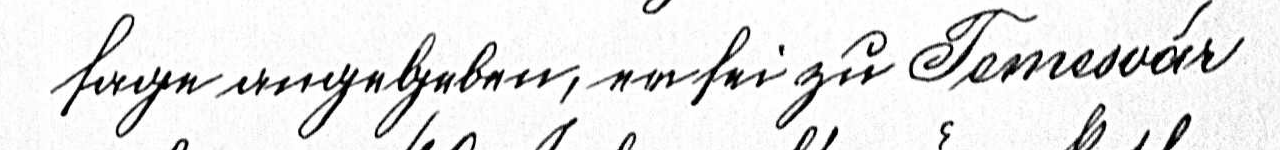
sage angegeben, er sei zu Temesvár
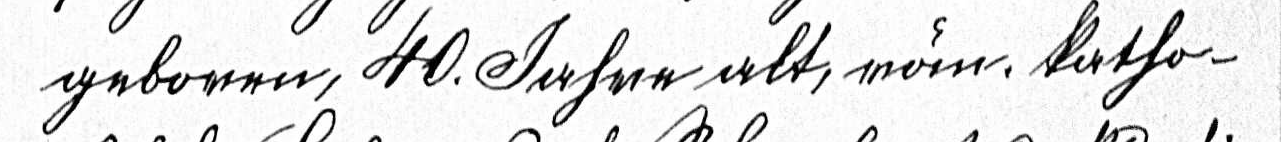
geboren, 40 Jahre alt, röm. Katho¬
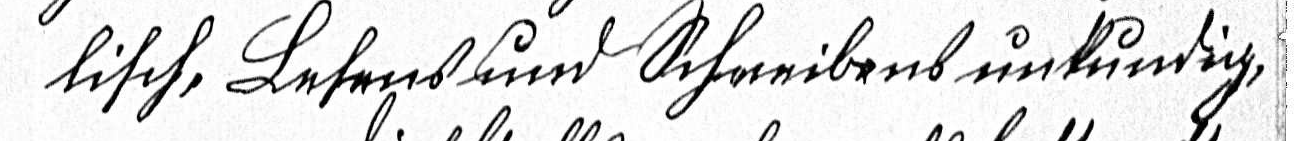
lisch, Lesens und Schreibens unkundig,
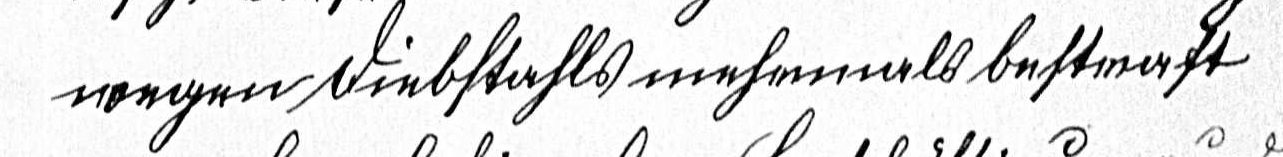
wegen Diebstahls mehrmals bestraft
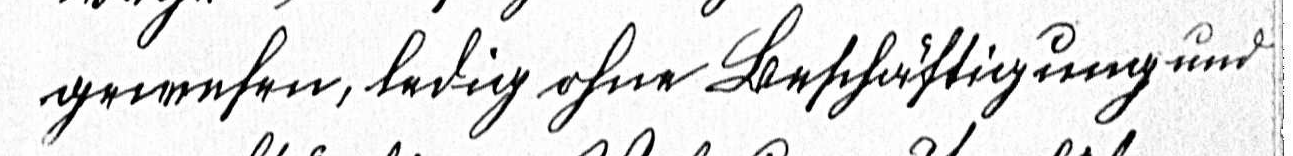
gewesen, ledig ohne Beschäftigung und
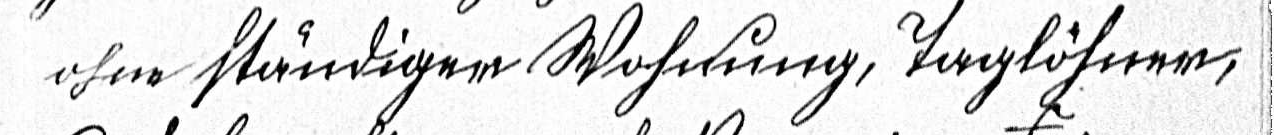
ohne ständiger Wohnung, Taglöhner,
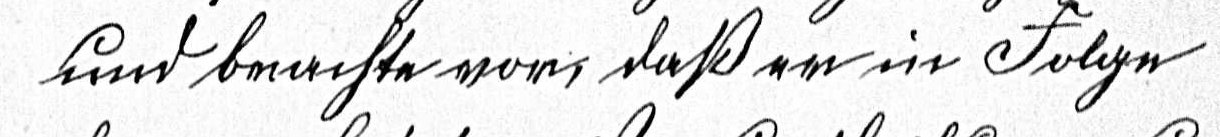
und brachte vor, daß er in Folge
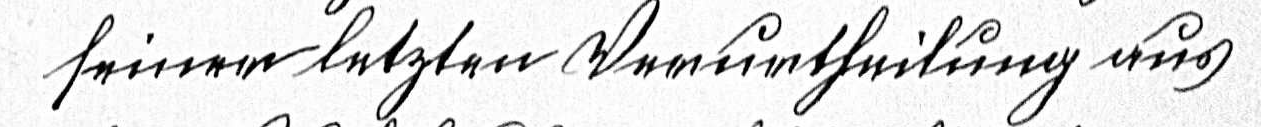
seiner letzten Verurtheilung aus
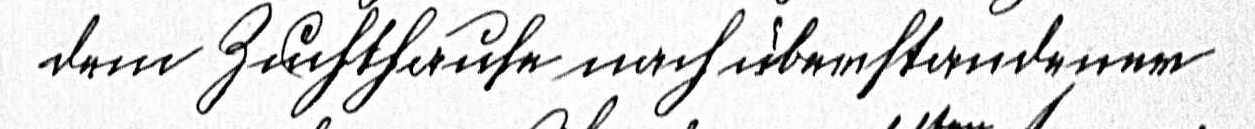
dem Zuchthause nach überstandener
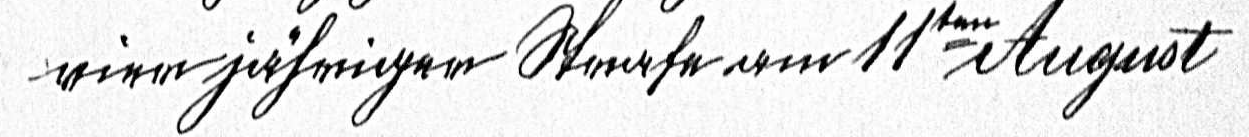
vierjähriger Strafe am 11ten August
